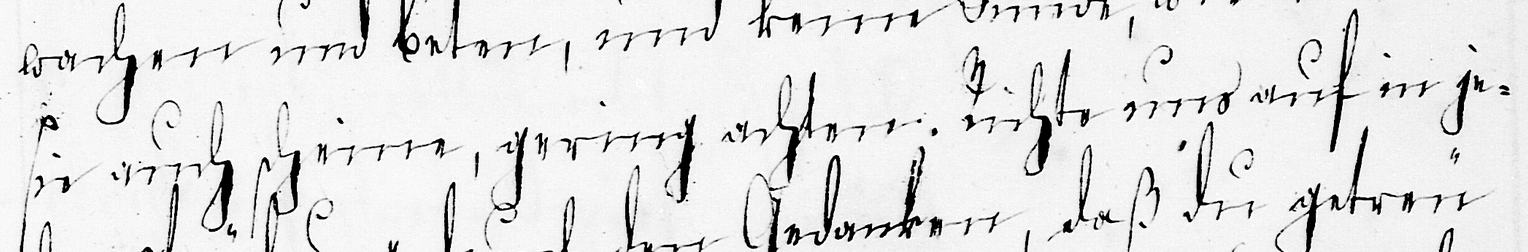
sie auch scheine, gering achten. Richte uns auf in je¬
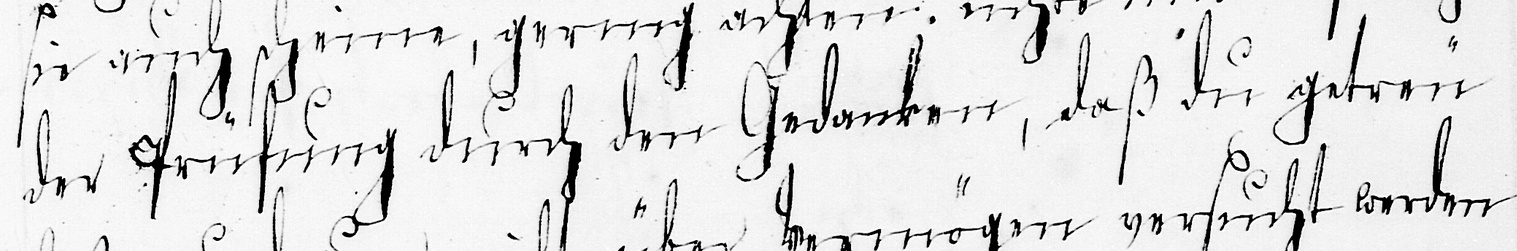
der Prüfung durch den Gedanken, daß du getreu
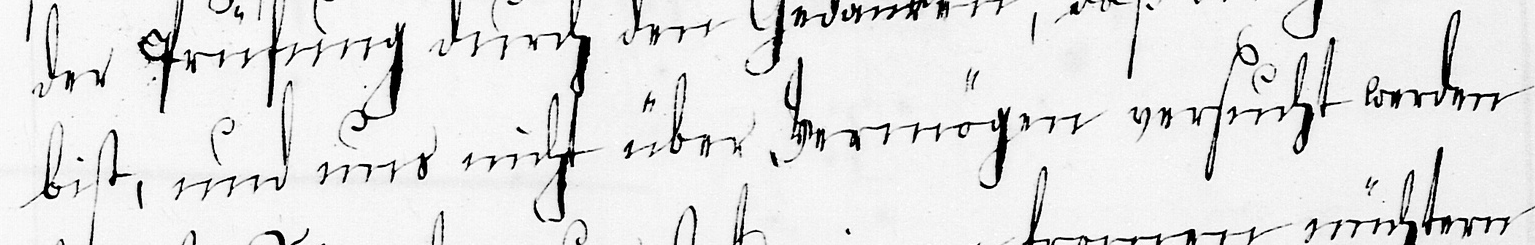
bist, und uns nicht über Vermögen versucht werden
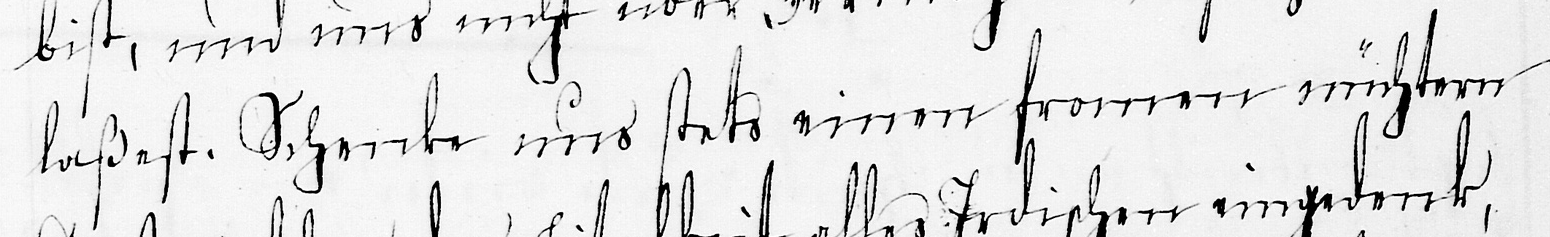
laßest. Schenke uns stets einen fromen nüchtern
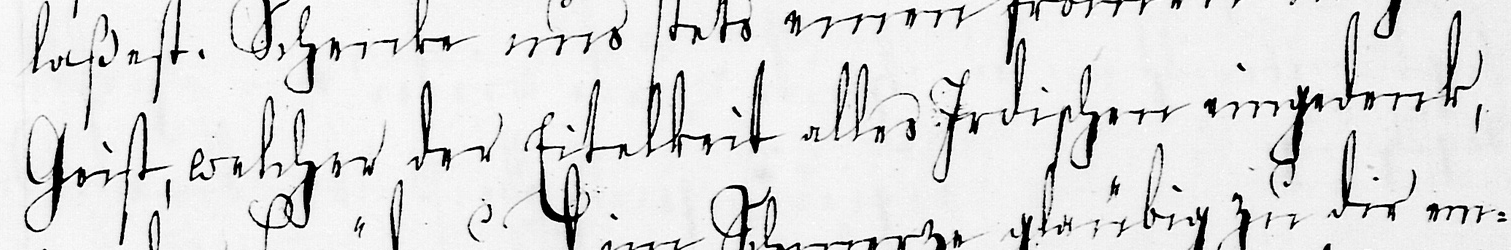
Geist, welcher der Eitelkeit alles Irdischen eingedenk,
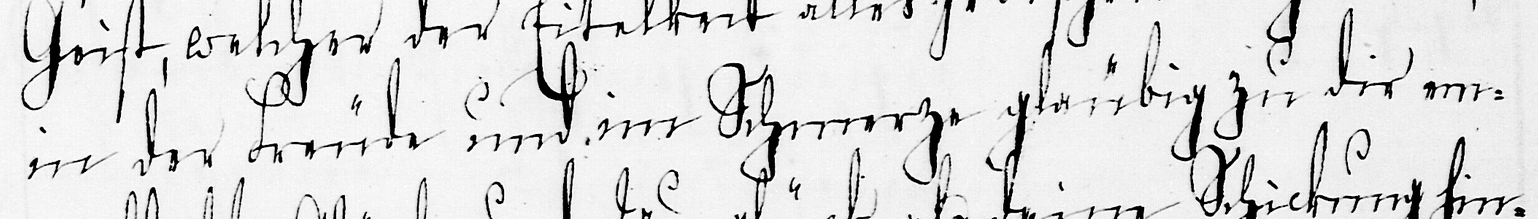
in der Freude und im Schmerze gläubig zu dir em¬
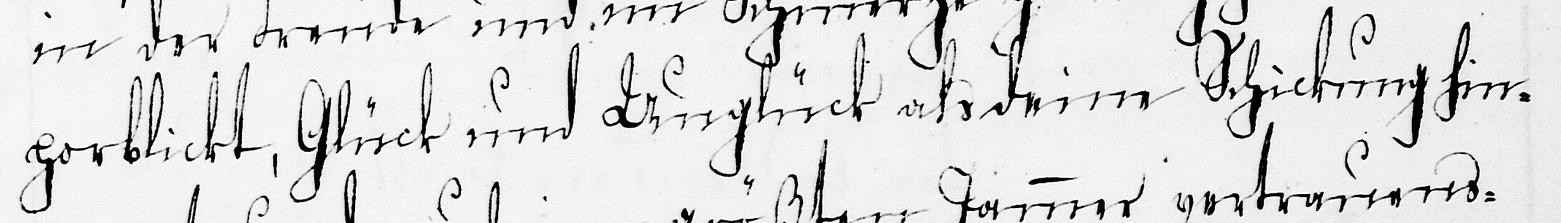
porblickt, Glück und Unglück als deine Schickung hin¬
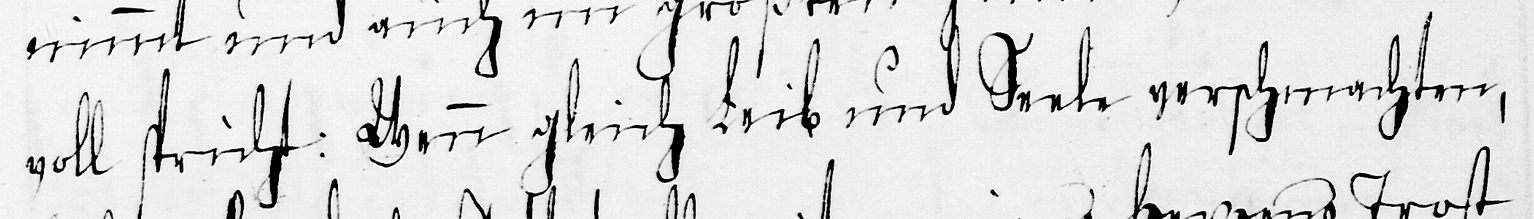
oll spricht: Wenn gleich Leib und Seele verschmachten,
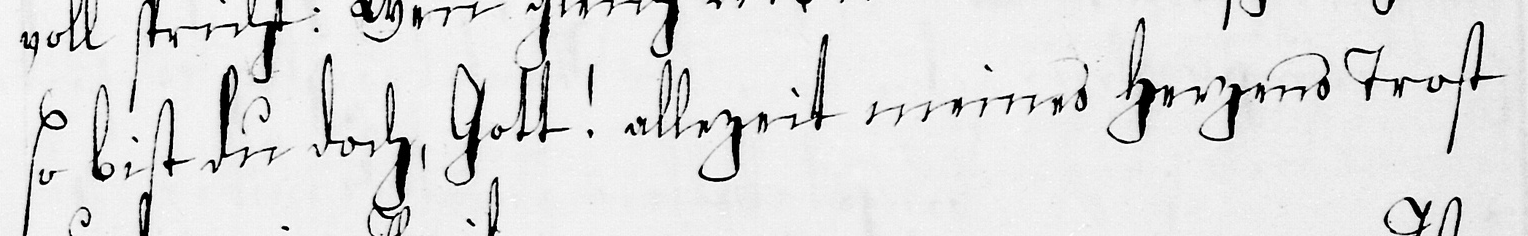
so bist du doch, Gott! allzeit meines Herzens Trost
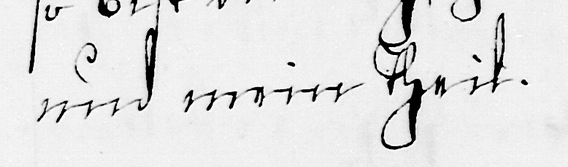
und mein Theil.
